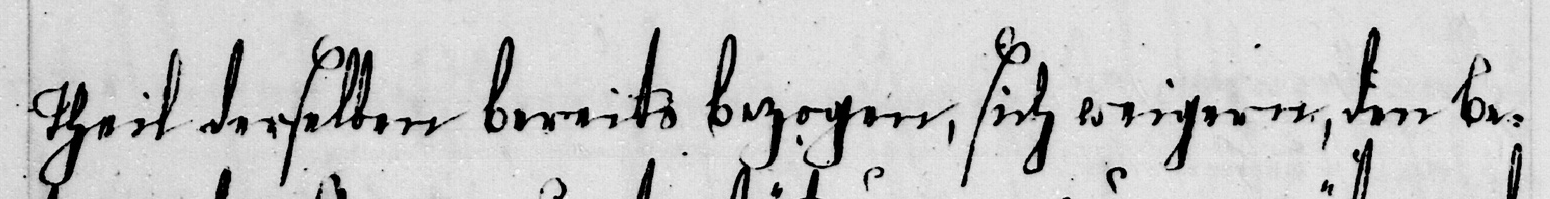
Theil derselben bereits bezogen, sich weigern, den Be¬
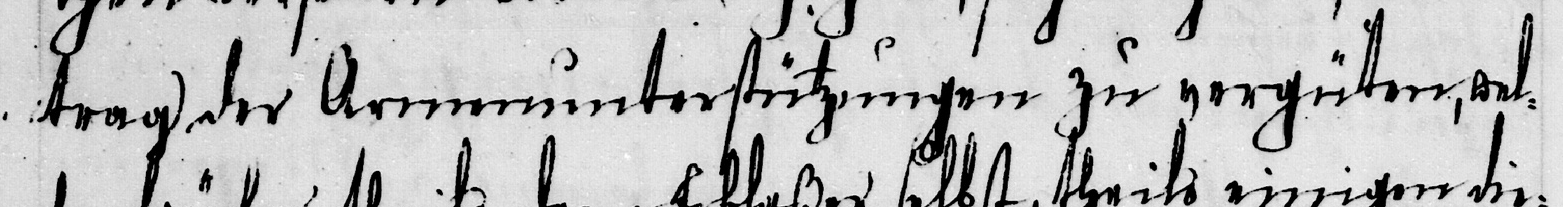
trag der Armenunterstützungen zu vergüten, wel¬
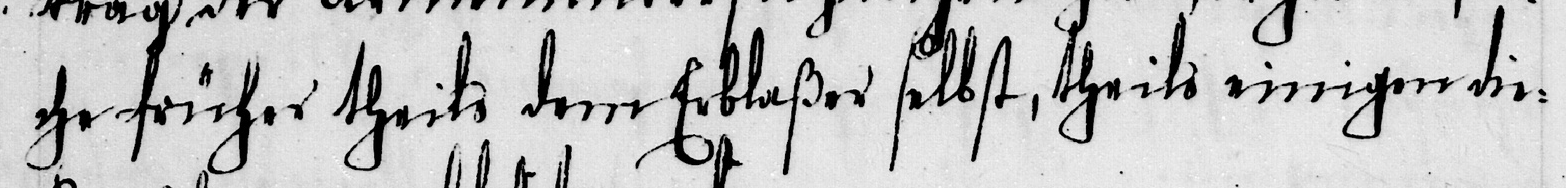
che früher theils dem Erblaßer selbst, theils einigen die¬
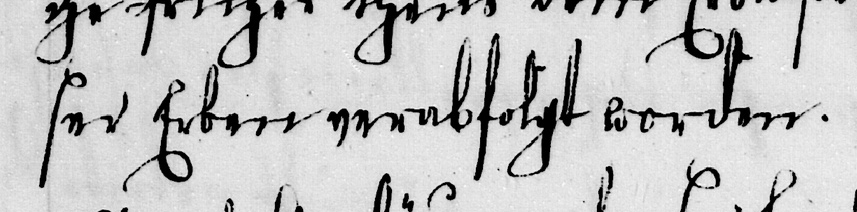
ser Erben verabfolgt worden.
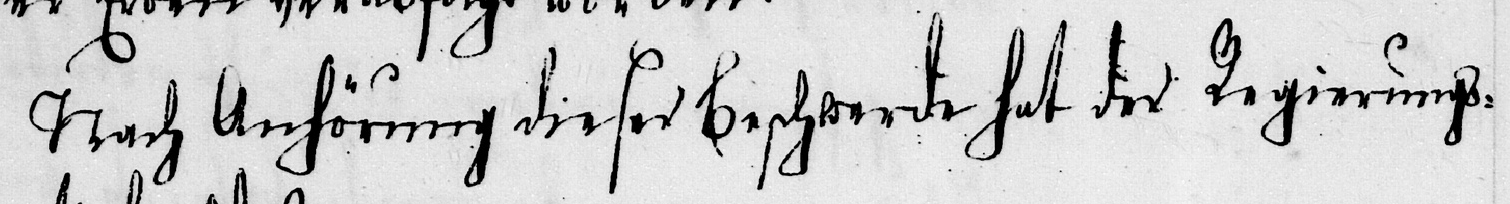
Nach Anhörung dieser Beschwerde hat der Regierungs¬
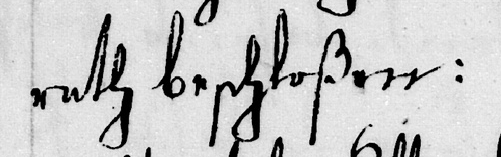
rath beschloßen:
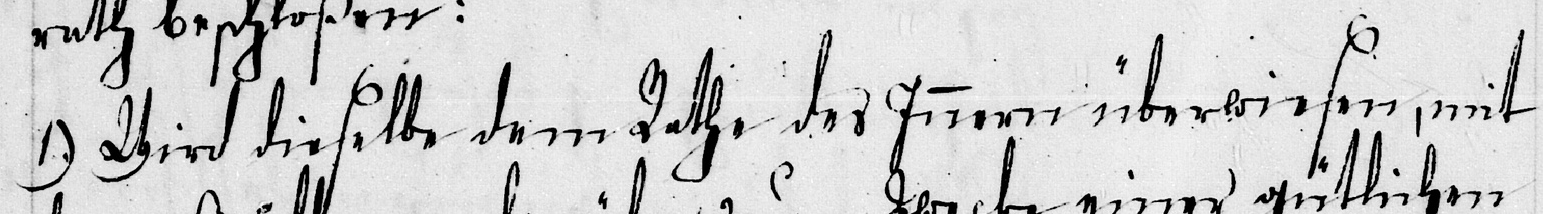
1.) Wird dieselbe dem Rathe des Innern überwiesen, mit
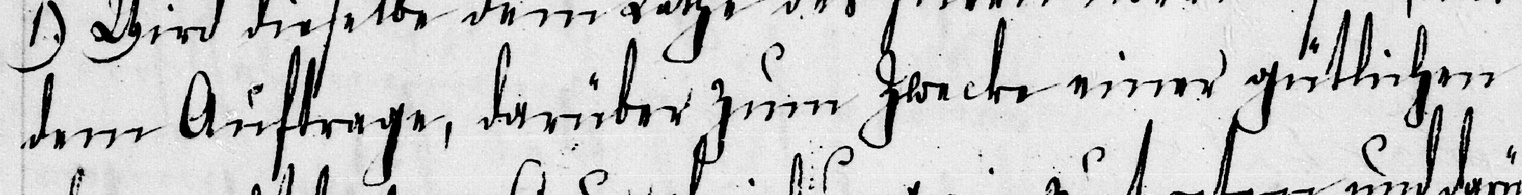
dem Auftrage, darüber zum Zwecke einer gütlichen
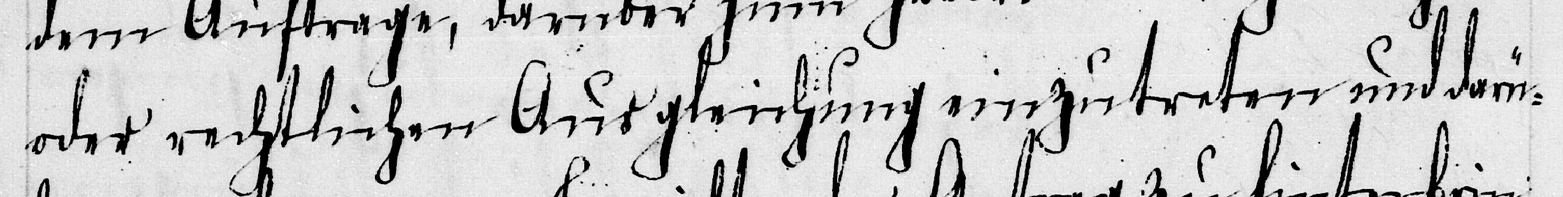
oder rechtlichen Ausgleichung einzutreten und darü¬
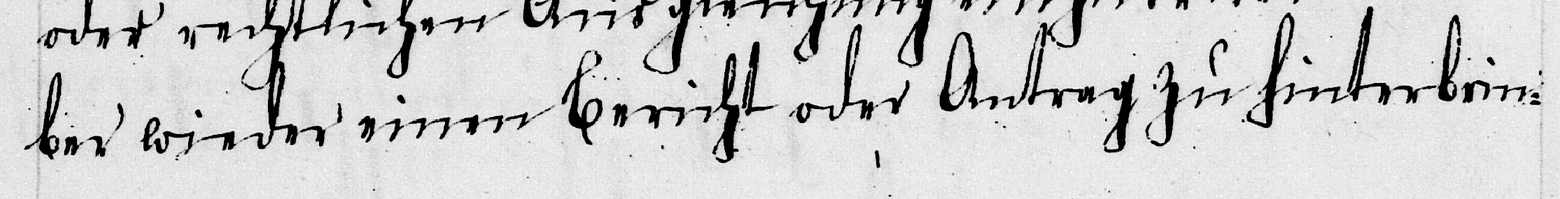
ber wieder einen Bericht oder Antrag zu hinterbrin¬
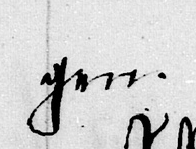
gen.
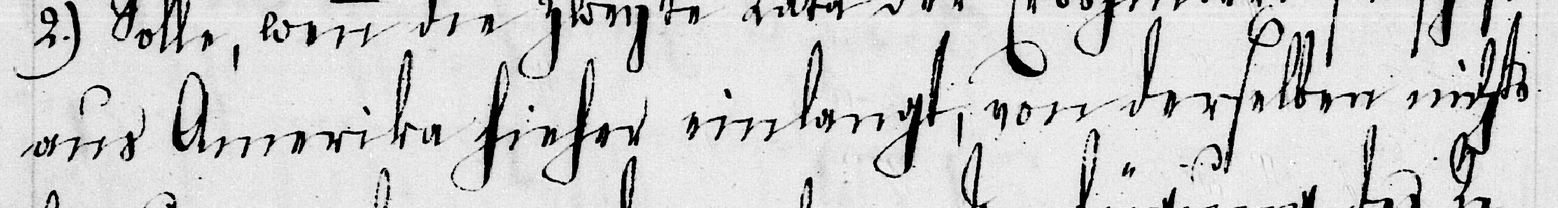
aus Amerika hieher einlangt, von derselben nichts
